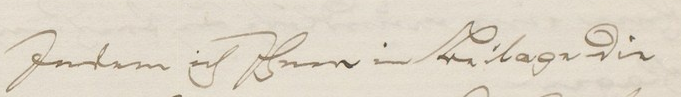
Indem ich Ihnen in Beilage die
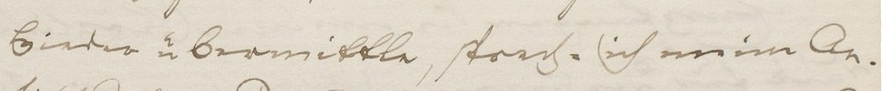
wieder übermittle, spreche ich meine An-
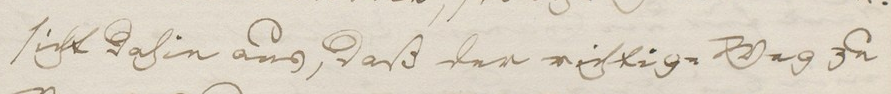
sicht dahin aus, daß der richtige Weg zu
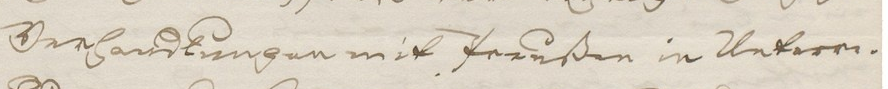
Verhandlungen mit Preußen in Unterre-
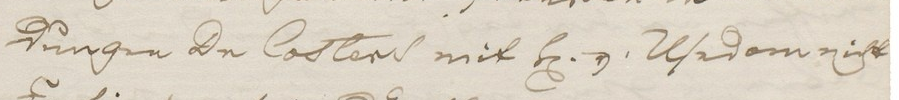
dungen Du Costers mit Hrn. v. Usedom nicht
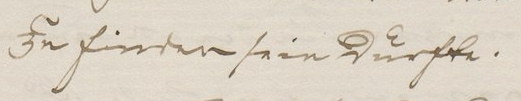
zu finden sein dürfte.
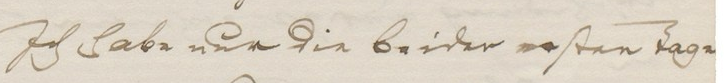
Ich habe nur die beiden ersten Tage
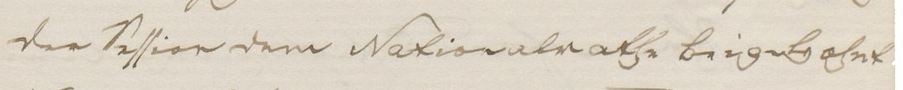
der Session dem Nationalrathe beigewohnt.
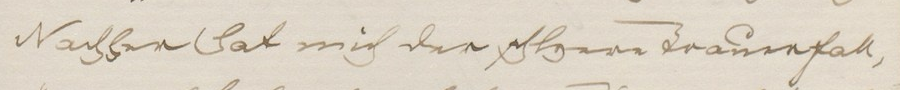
Nachher hat mich der schwere Trauerfall,
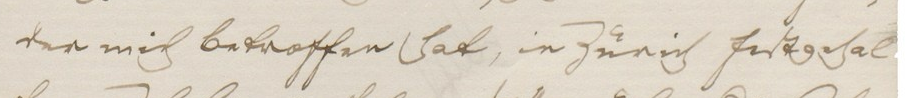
der mich betroffen hat, in Zürich festgehal-
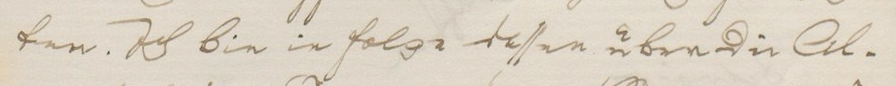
ten. Ich bin in folge dessen über die Al-
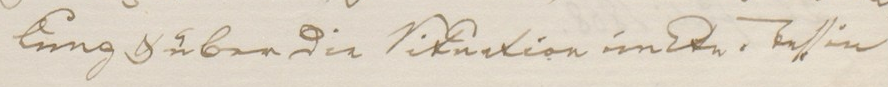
lung & über die Situation im Ctn. Tessin
